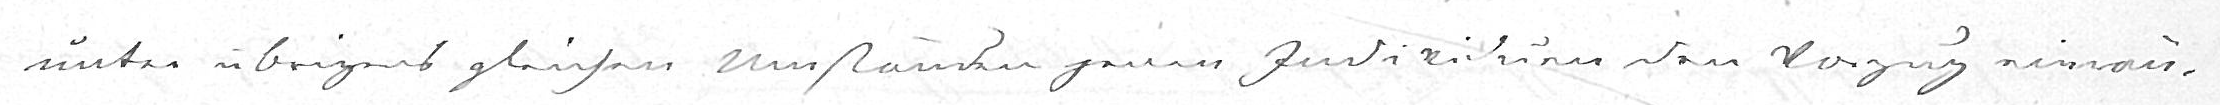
unter übrigens gleichen Umständen jenen Individuen den Vorzug einräu-
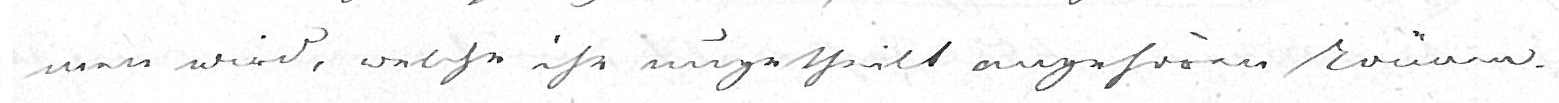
men wird, welche ihr ungetheilt angehören können.
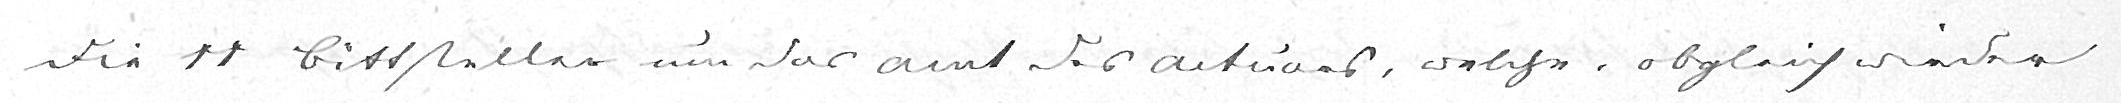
Die 11 Bittsteller um das Amt des Actuars, welche, obgleich wieder
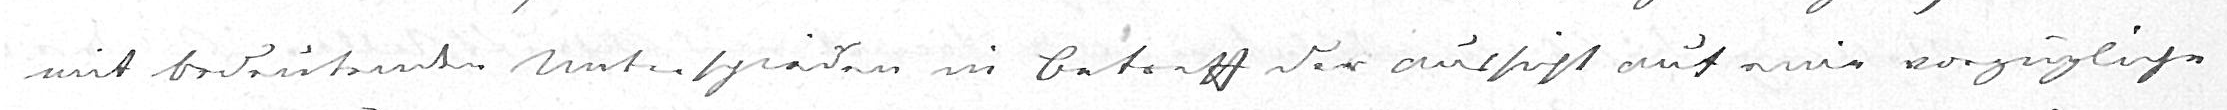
mit bedeutenden Unterschieden in Betreff der Aussicht auf eine vorzügliche
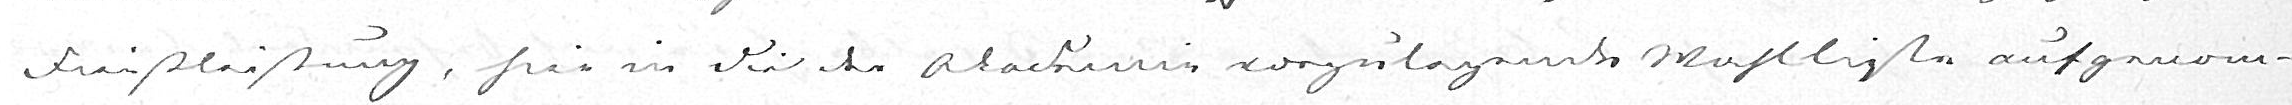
Dienstleistung, hier in die der Akademie vorzulegenende Wahlliste aufgenom-
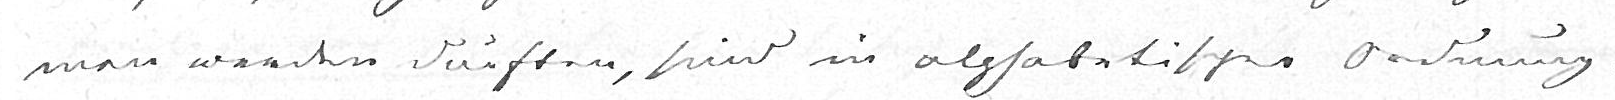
men werden dürften, sind in alphabetischer Ordnung:
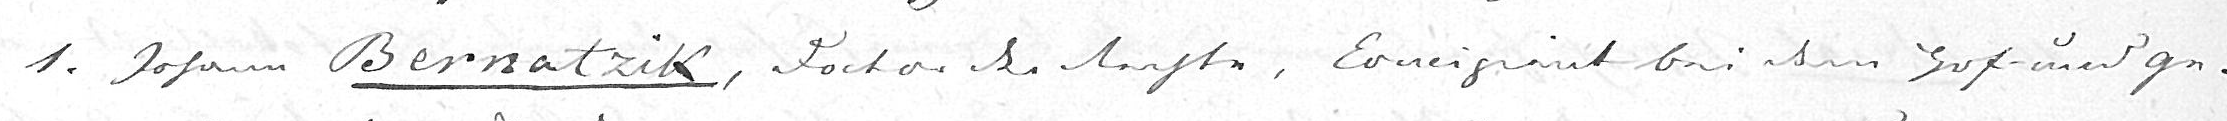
1. Johann Bernatzik, Doctor der Rechte, Concipient bei dem Hof- und Ge-
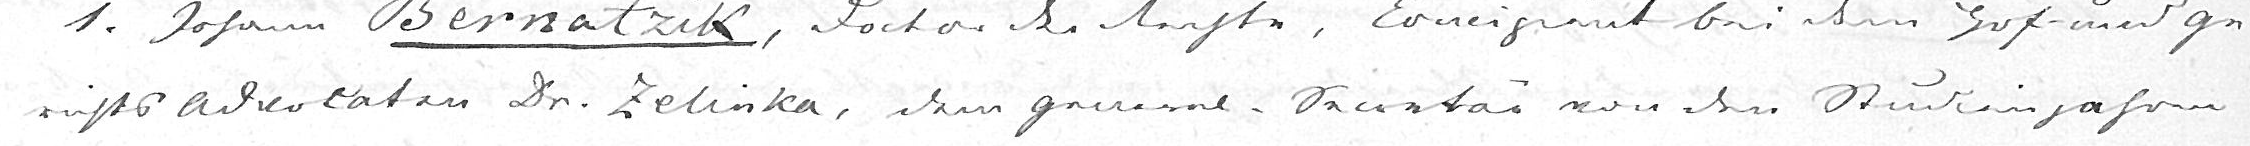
richtsAdvocaten Dr. Zelinka, dem General-Secretär von den Studienjahren
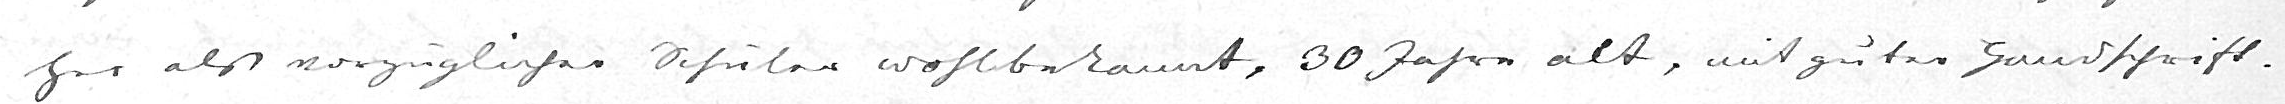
her als vorzüglicher Schüler wohlbekannt, 30 Jahre alt, mit guter Handschrift.
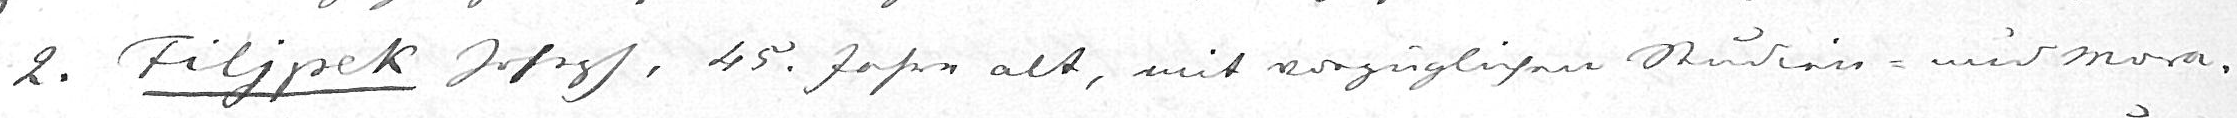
2. Filjpek Joseph, 45. Jahre alt, mit vorzüglichen Studien und Mora-
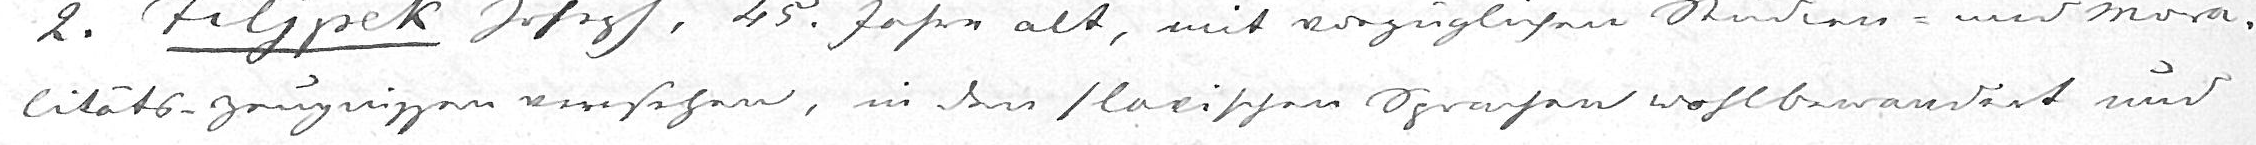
litäts-Zeugnissen versehen, in den slavischen Sprachen wohlbewandert und
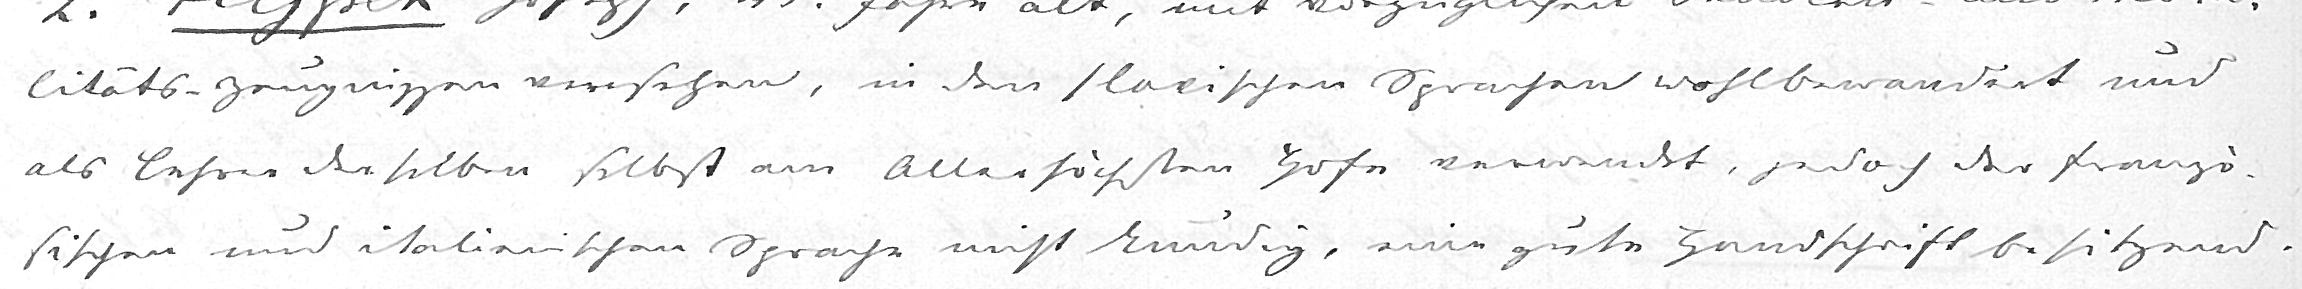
sischen und italienischen Sprache nicht kundig, eine gute Handschrift besitzend.
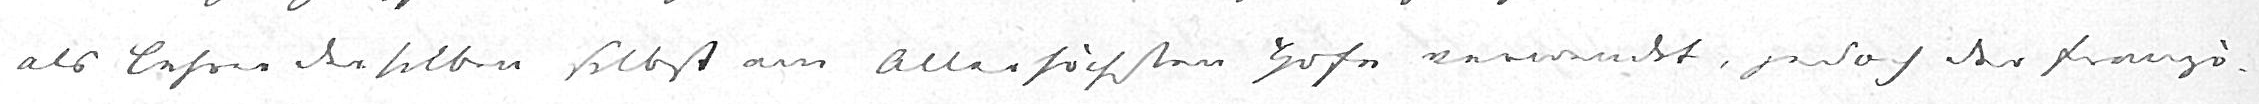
als Lehrer derselben selbst am Allerhöchsten Hofe verwendet, jedoch der franzö-
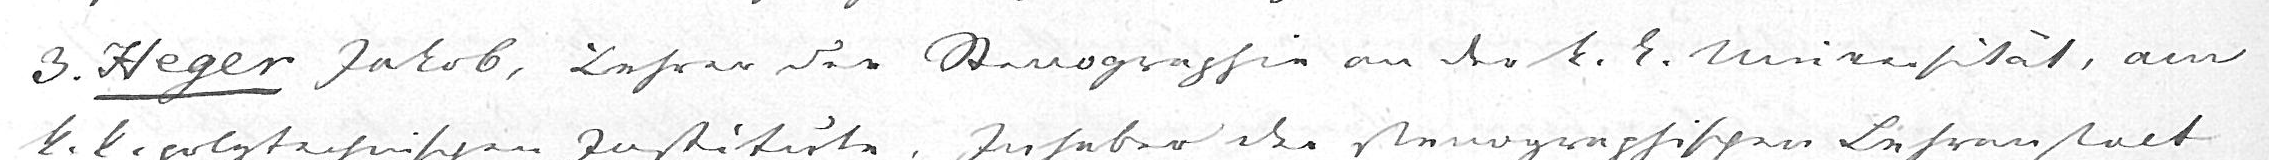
3. Heger Jakob, Lehrer der Stenographie an der k.k. Universität, am
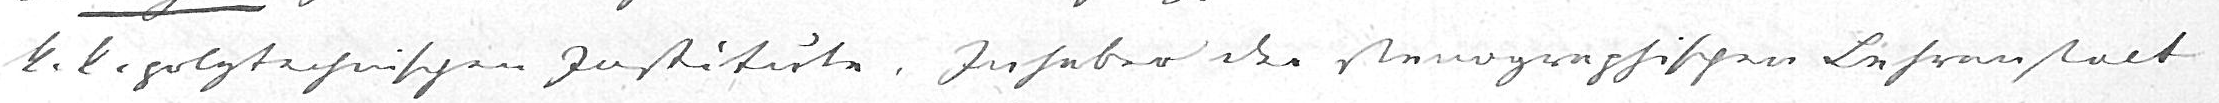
k.k. polytechnischen Institute, Inhaber der stenographischen Lehranstalt
